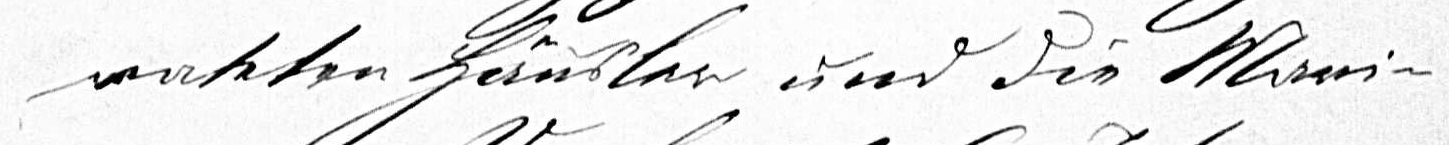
rateten Häusler und die Mari¬
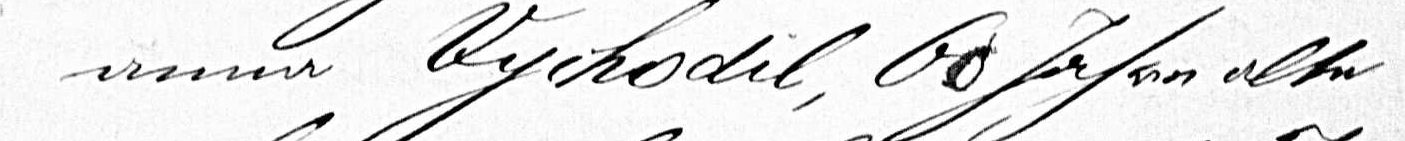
anna Vychodil, 60 Jahre alte
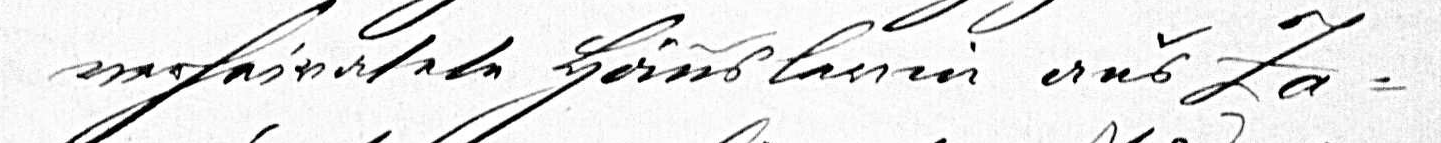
verheiratete Häuslerin aus Za¬
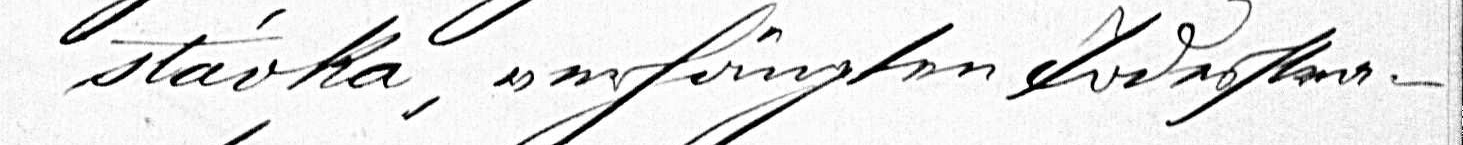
stávka, verhängten Todesstra¬
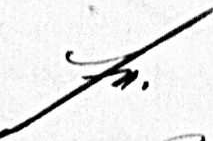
fe.
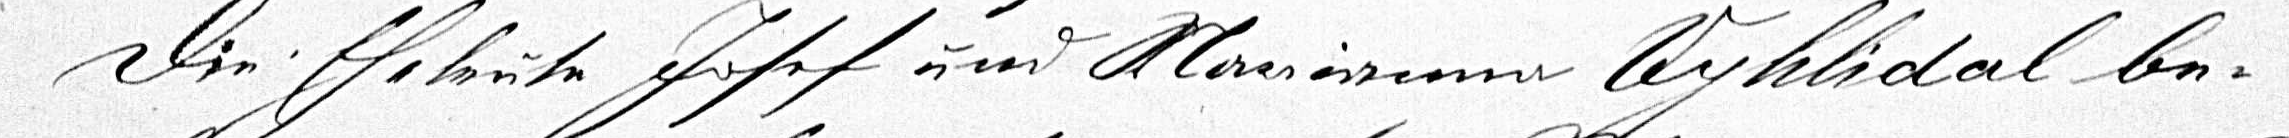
Die Eheleute Josef und Marianna Vyhlidal be¬
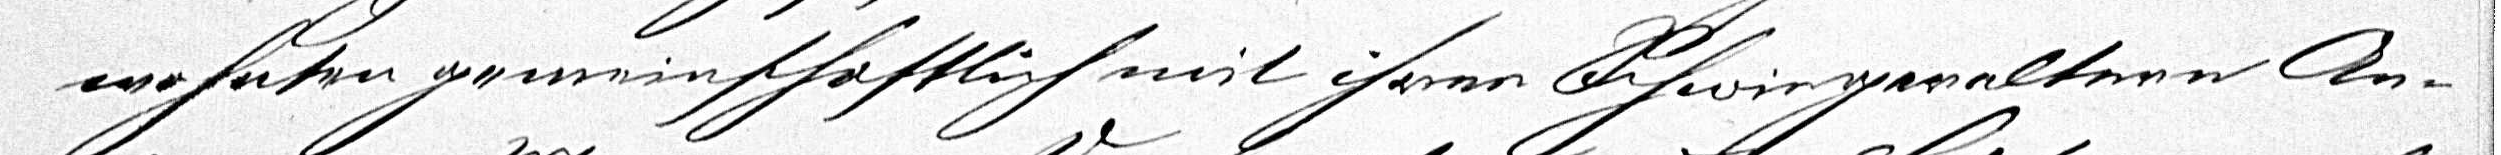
wohnten gemeinschaftlich mit ihren Schwiegxx An¬
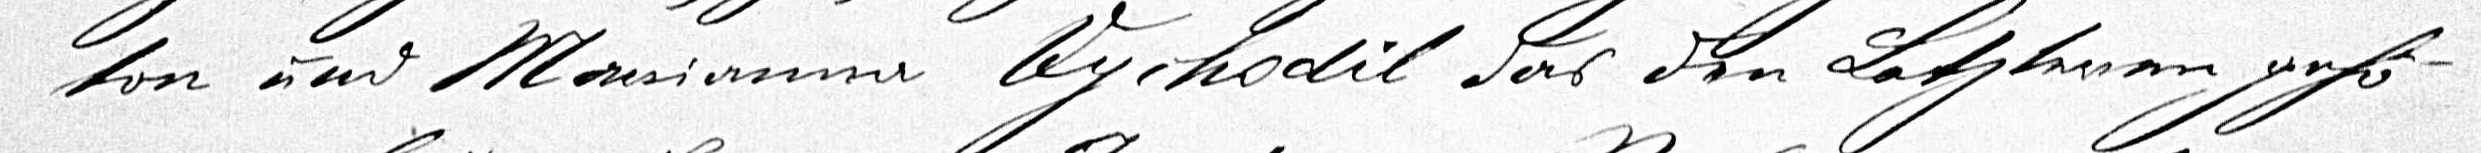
ton und Marianna Vychodil das den Letzteren gehö¬
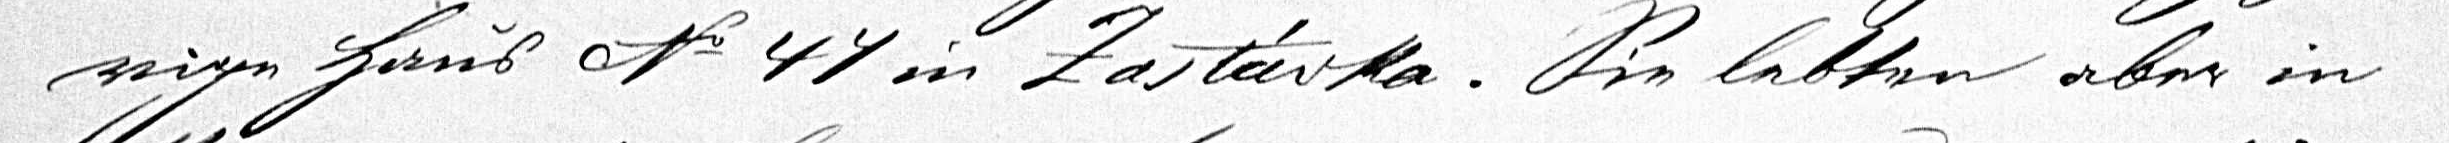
rige Haus No. 47 in Zastávka. Sie lebten aber in
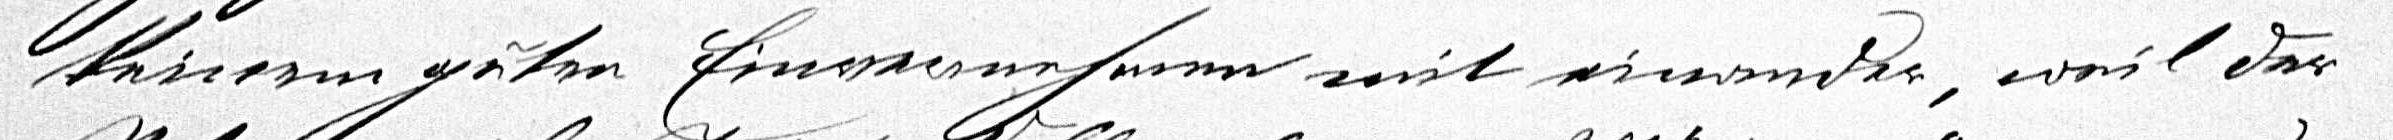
keinem guten Einvernehmen mit einander, weil der
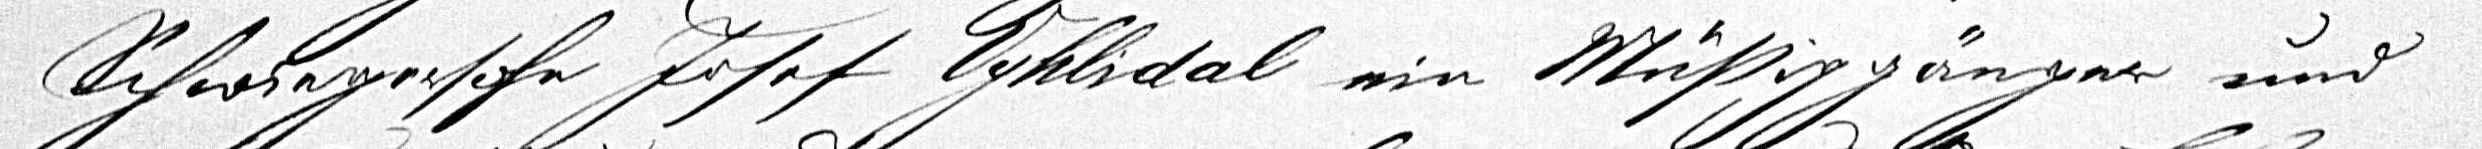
Schwiegersohn Josef Vyhlidal ein Müßiggänger und
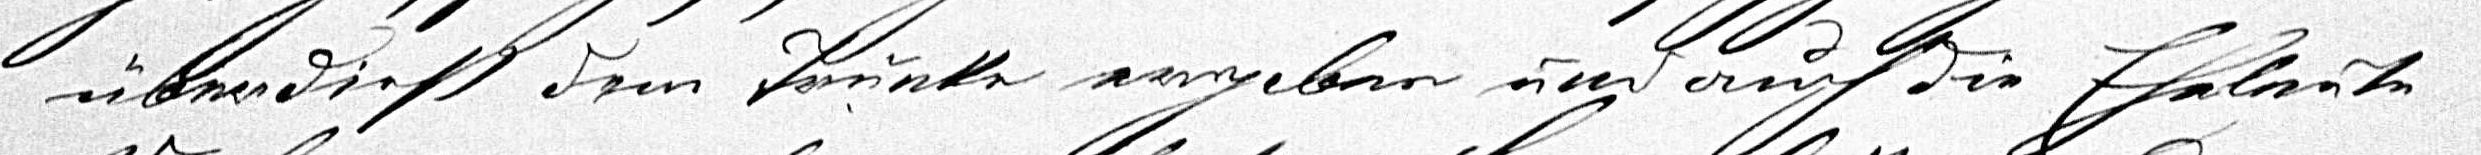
überdieß dem Trunke ergeben und auch die Eheleute
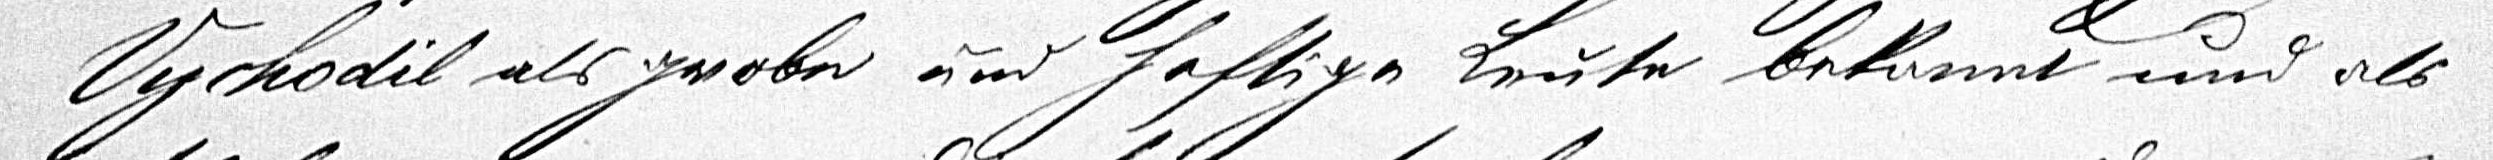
Vychodil als grobe und haftige Leute bekannt und als
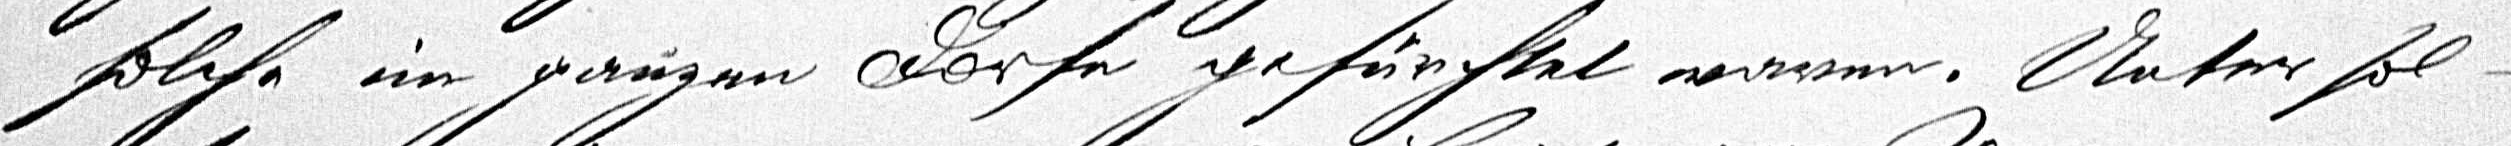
solche im ganzen Dorfe gefürchtet waren. Unter sol¬
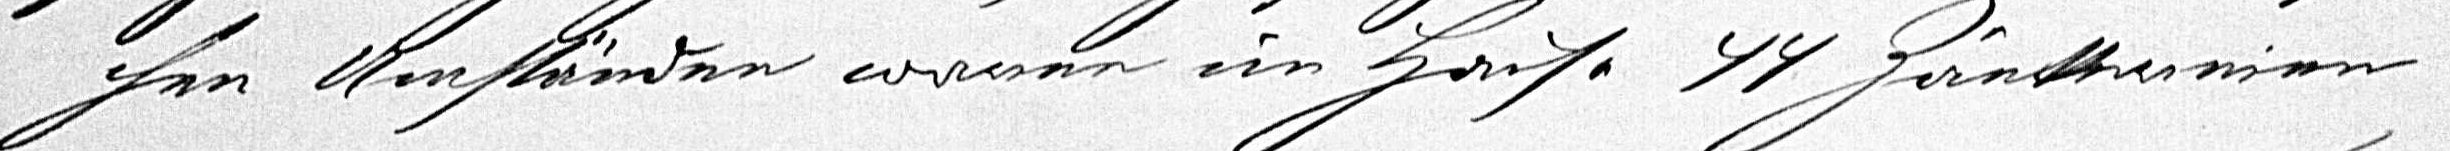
chen Umständen waren im Hause 44 Zänxx
